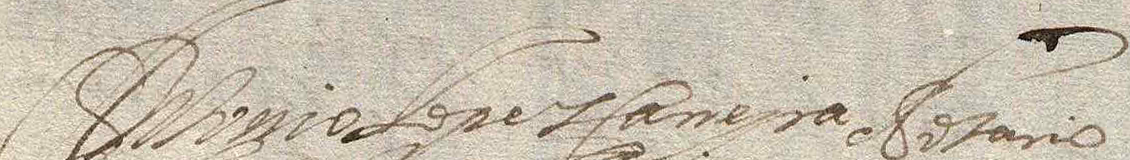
Antonio Lopez Carrejra Notario
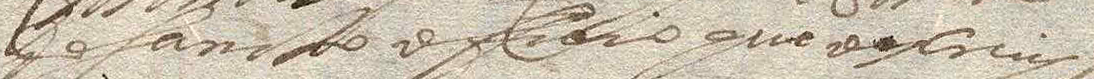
do sancto officio que o escreuj
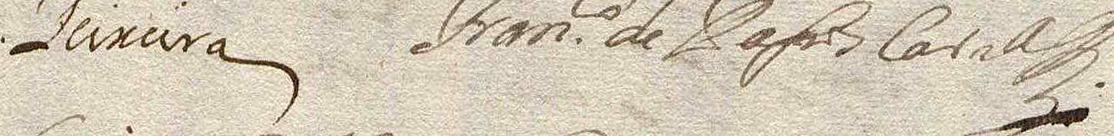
Teixeira Fran.co de Passos Carv.a
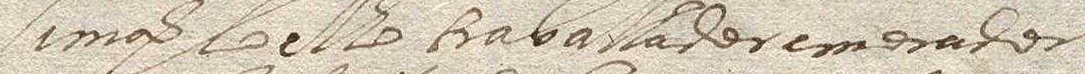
Simaõ Coelho trabalhador, e morador
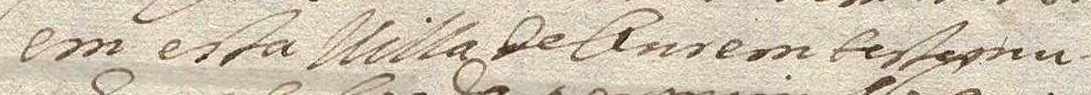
em esta Villa de Ourem testemu
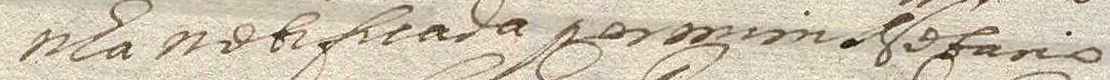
nha notificada por mim Notario
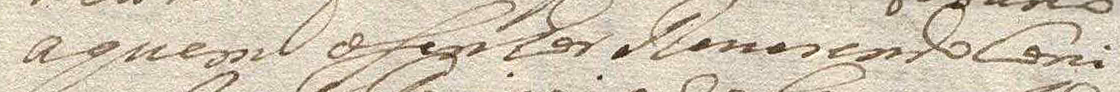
a quem o Senhor Reuerendo Coni
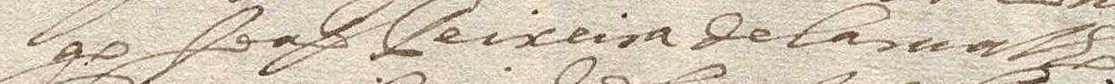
go Joaõ Teixeira de Carualho
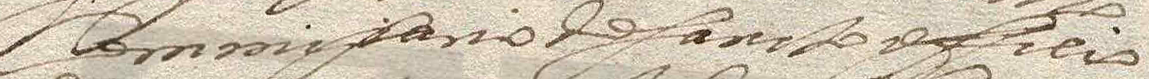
Commissario do sancto officio
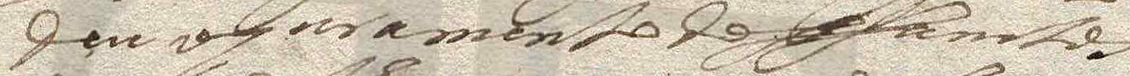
deu o juramento dos santos
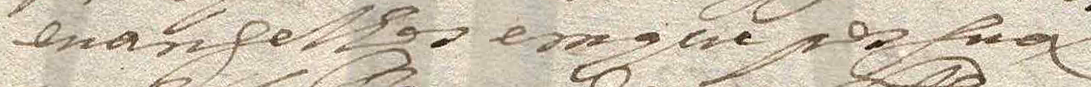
euangelhos em que pos sua
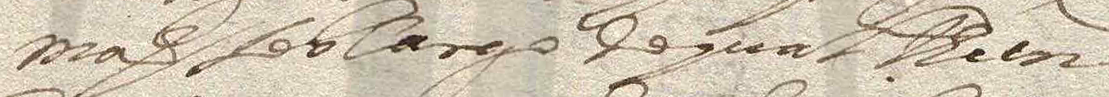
maõ sob cargo do qual lhe en
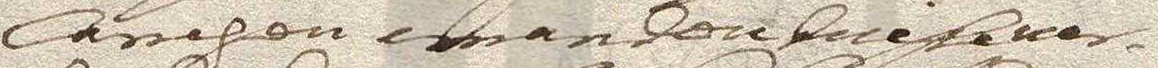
Carregou e mandou que dicesse ver
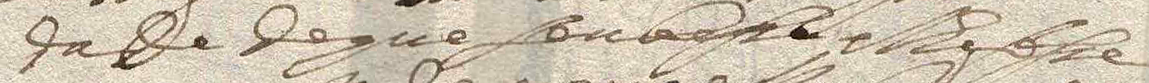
dade de que soubesse e lhe fosse
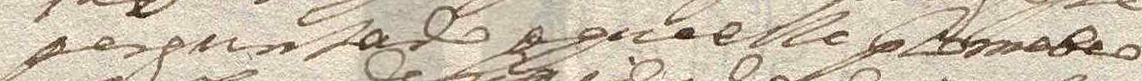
perguntado o que elle prometeo
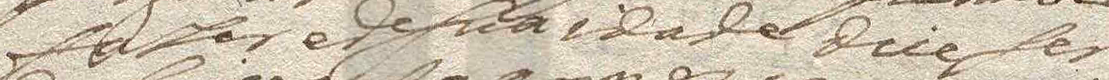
fazer e de sua idade dice ser
